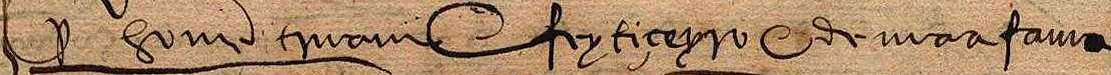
p̄o homē truam e feyticeyro e de maa fama
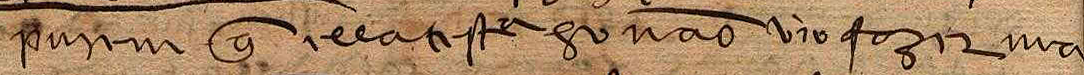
purem q̄ ella testa ho não vio fazer ma
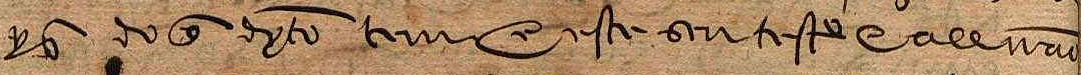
ys do q̄ dyto tem ē este seu testo e all não
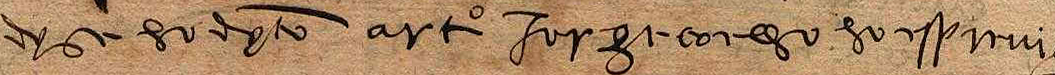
dyse ho dyto arto Jorge coelho ho espreui
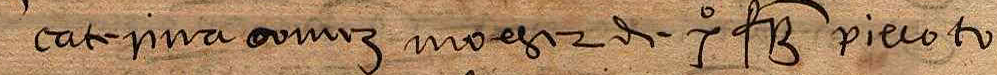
caterina gomez molher de po fr̄z pilloto
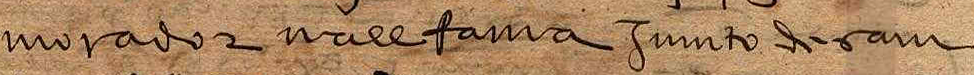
morador nallfama Jumto de sam
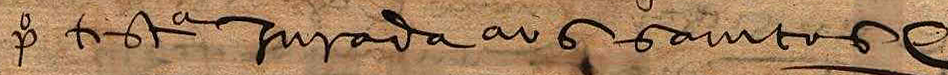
p̄o testa Jurada aos samtos e
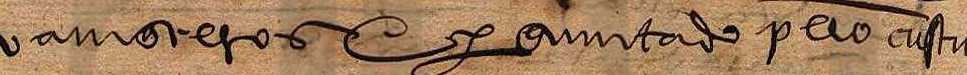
vamgelhos e ꝑgumtado p̄llo custu
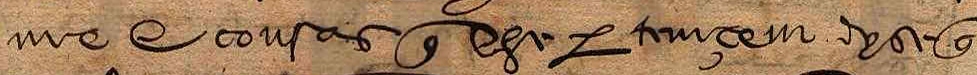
me e cousas q̄ lhe ꝑtemcem dyse q̄
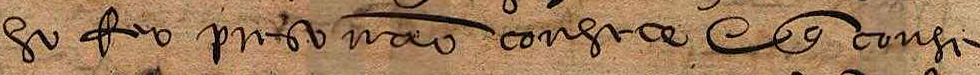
ho Reo preso não conhece e q̄ conhe
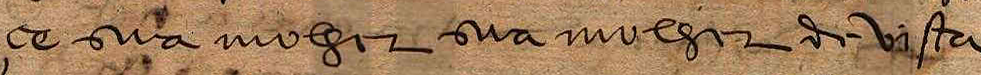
ce sua molher sua molher de vista
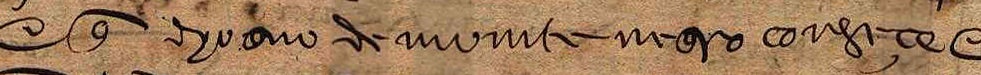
e q̄ dyoguo de momtenegro conhece e
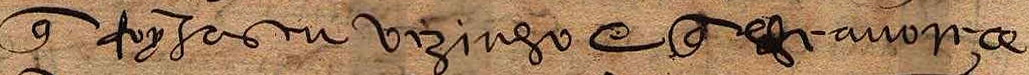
q̄ foy Ja seu vezinho e q̄ lhe auorece
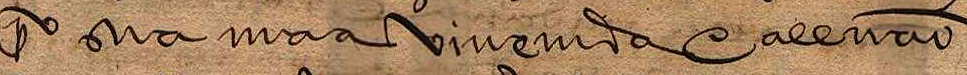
p̄o sua maa viuemda e all não
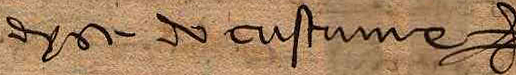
dyse do custume
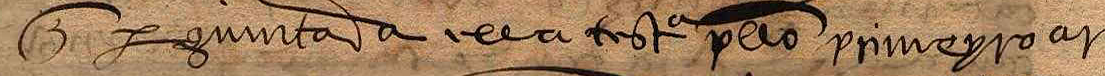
item ꝑgumtada ella testa p̄llo primeyro ar
